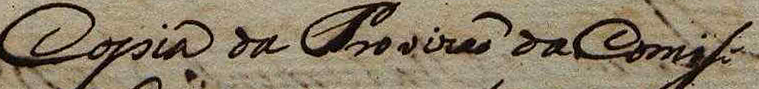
Copia da Provizaõ da Comis
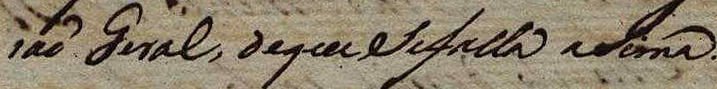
saõ Geral, de que se falla aSima.
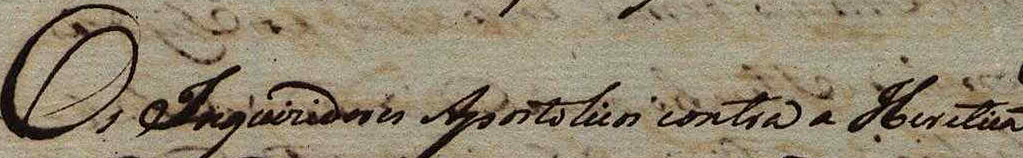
Os Inquizidores Apostolicos contra a Heretica
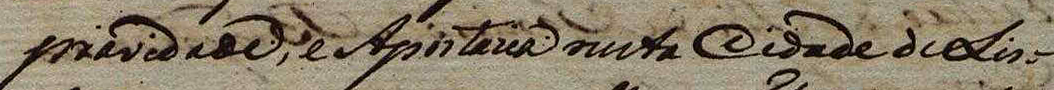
pravidade, e Apostazia nesta Cidade de Lis
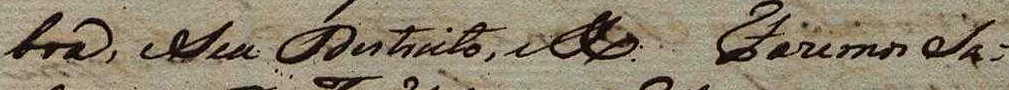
boa, e seu Destrito, &: Fazemos Sa
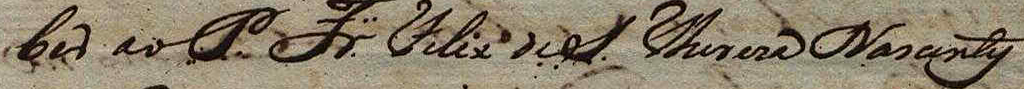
ber ao P. Fr. Felix de S. Thereza Nascentes
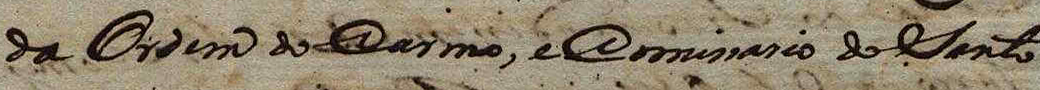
da Ordem do Carmo, e Comissario do Santo
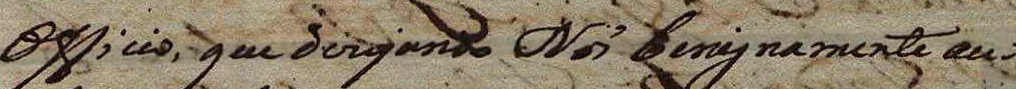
Officio, que dezejando Nós benignamente au
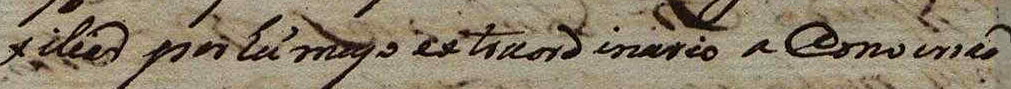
xiliar por hū meyo extraordinario a Conversaõ
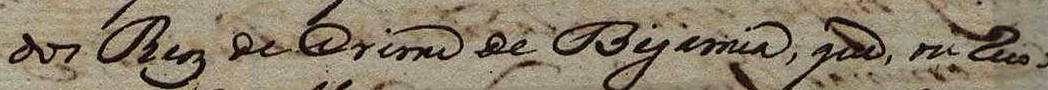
dos Reoz de Crime de Bigamia, que, ou Reco
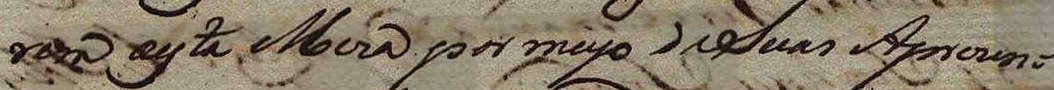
rem a esta Meza por meyo de Suas Aprezen
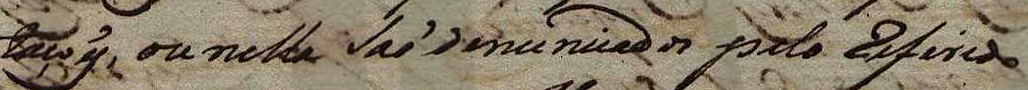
taçoẽs, ou nella saõ denunciados pelo Referido
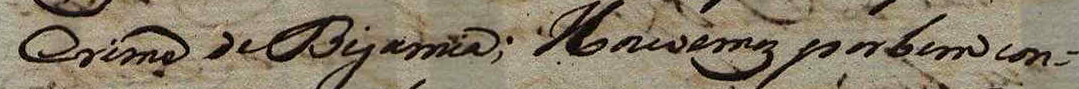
Crime de Bigamia; Houvemos por bem con
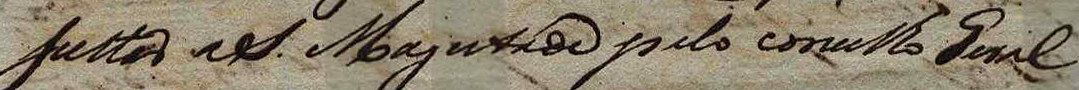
sultar a S. Majestade pelo concelho Geral
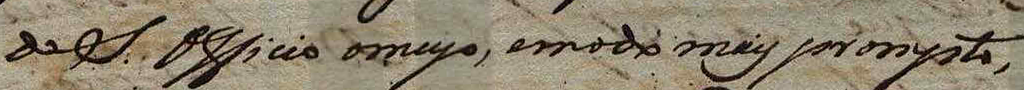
do S. Officio o meyo, e modo mais prompto,
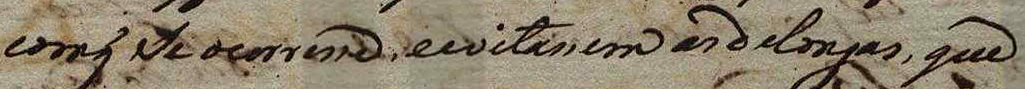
com q̄ se ocorresse, e evitassem as delongas, que
